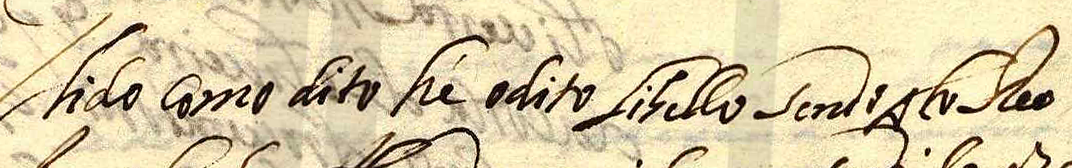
E lido como dito he o dito Libello sendo plo Reo
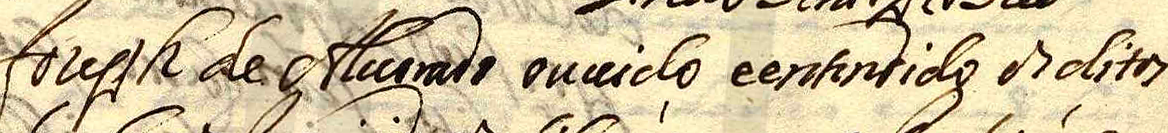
Jozeph de Aluorado ouuido e entendido os ditos
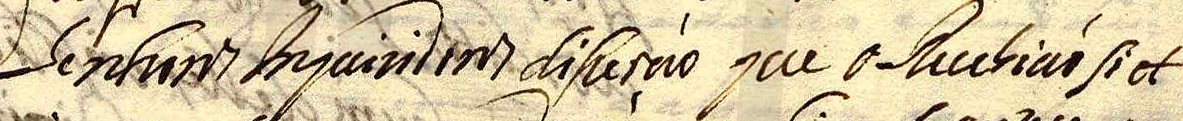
Senhores Inquisidores disseraõ que o Recebiaõ si et
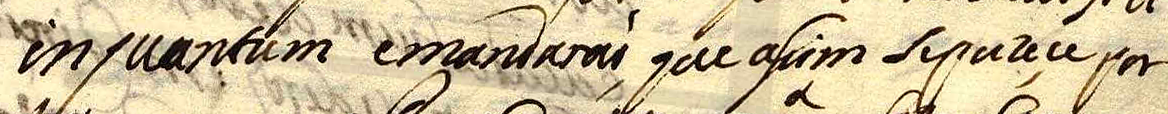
in quantum e mandaraõ, que asim se puzeçe por
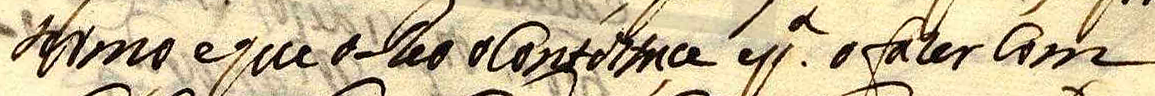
termo e que o Reo o Contestaçe e p.a o fazer com
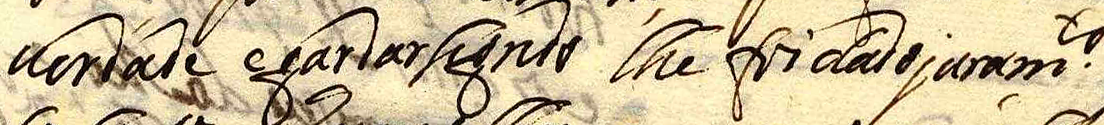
uerdade e guardar segredo lhe foi dado juram.to
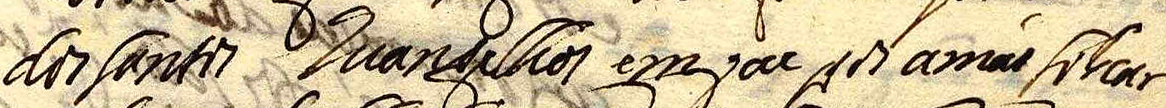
dos santos Euangelhos em que pos a maõ sob car
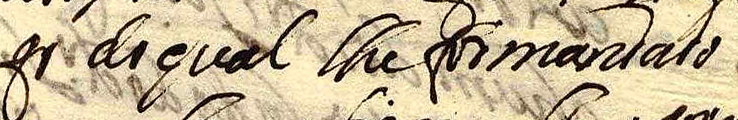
go do qual lhe foi mandado
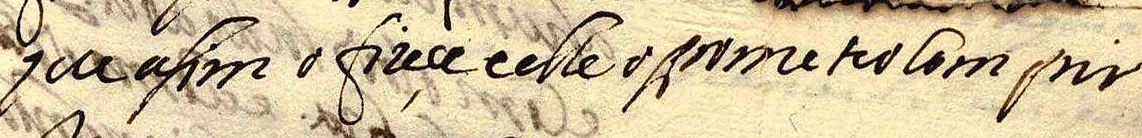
que asim o fizeçe e elle o prometeo comprir
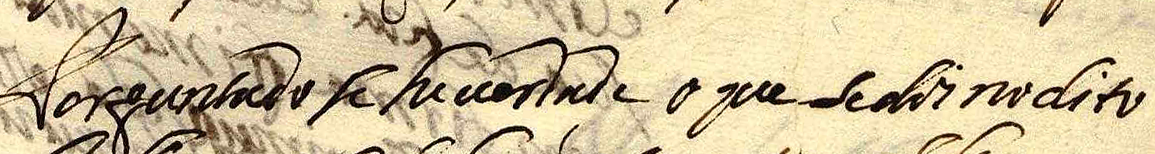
Perguntado se he uerdade o que se dis no dito
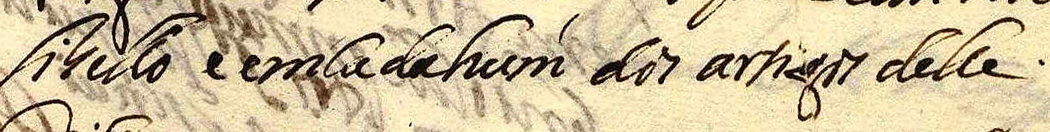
libello e em cada hum dos artigos delle
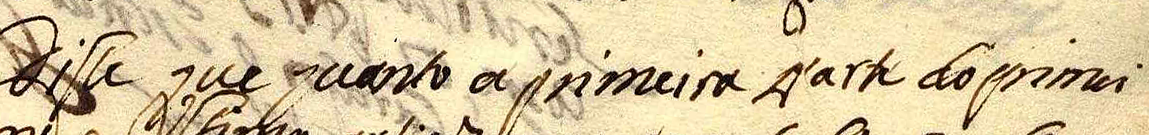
Disse que quanto a primeira parte do primei
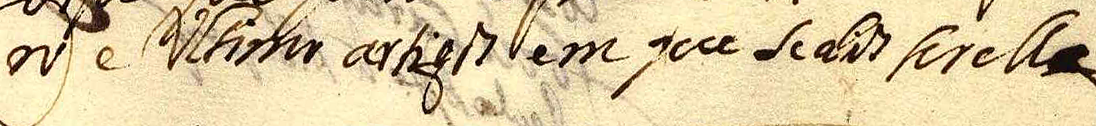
ro e Vltimo artigos em que se dis ser ella
